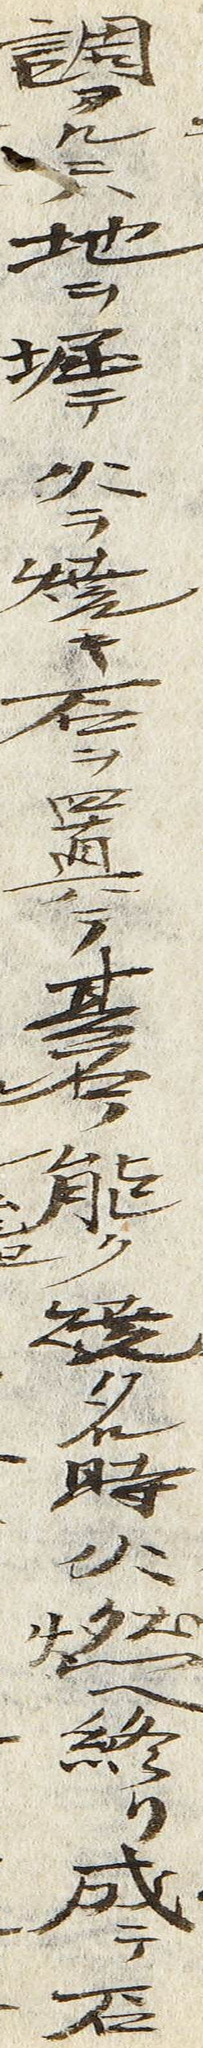調フルニハ掘テ火ヲ焼キ石ヲ置テ其石ノ能ク焼タル時火燃ヘ終リ成テ石
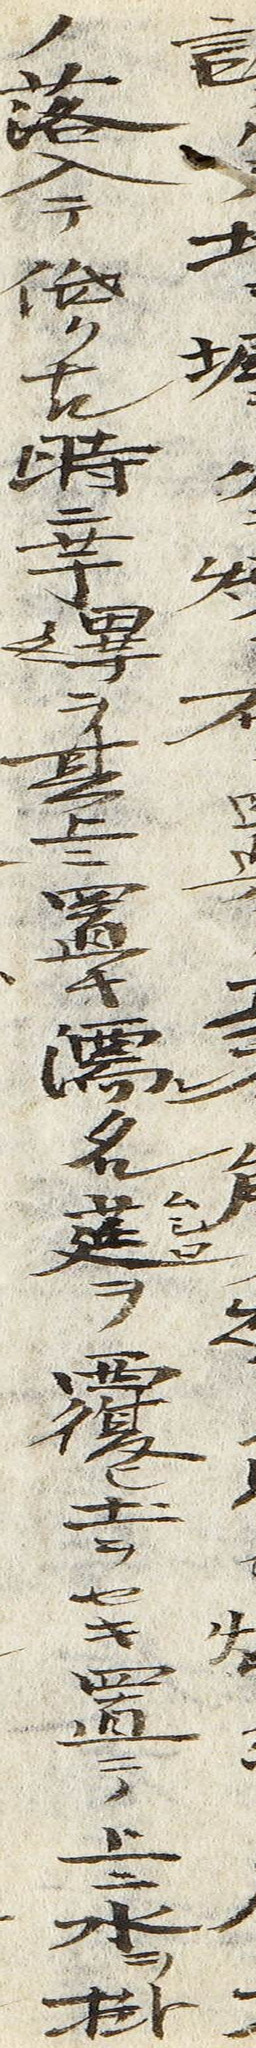ノ落入テ低リナル時二芋ヲ其上ニ置キ濡レタル筵ヲ覆ヒ土ヲセキ置テ上ニ水ヲ掛
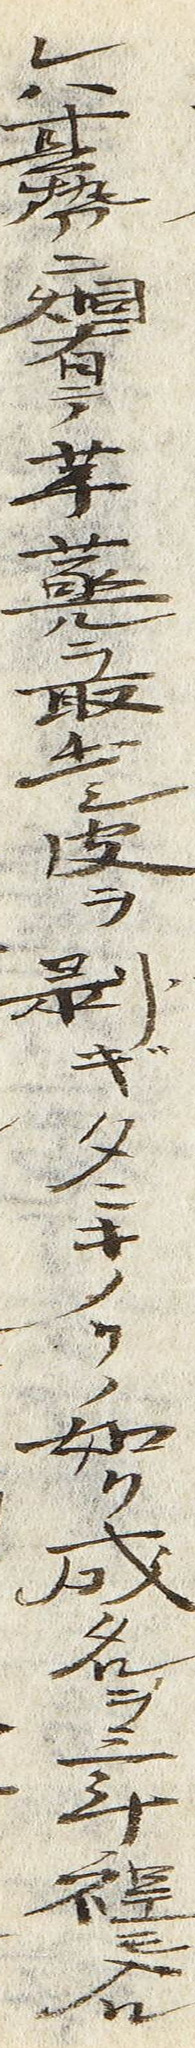レハ其勢ニ烔有テ芋蒸ルラ取出シ皮ヲ剥ギタニキノリノ如ク成タルヲ三斗程モ入ル
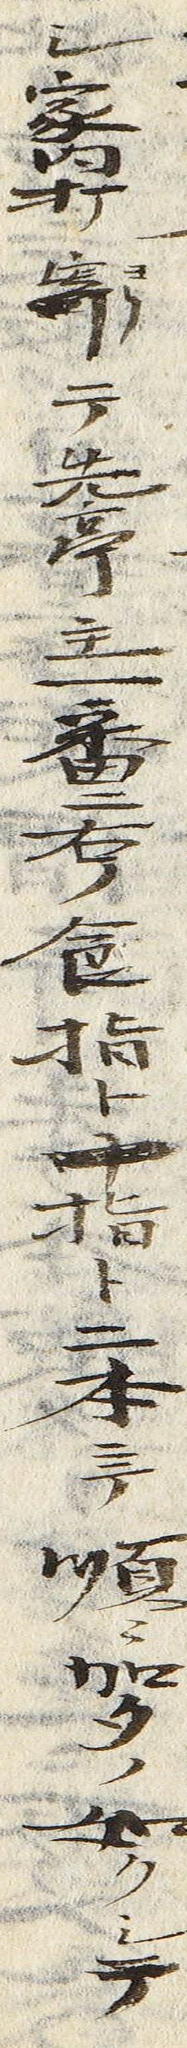シ家内打寄テ先亭主一番ニ右ノ食指ト中指ト二本ニテ準々加タノ如クシテ
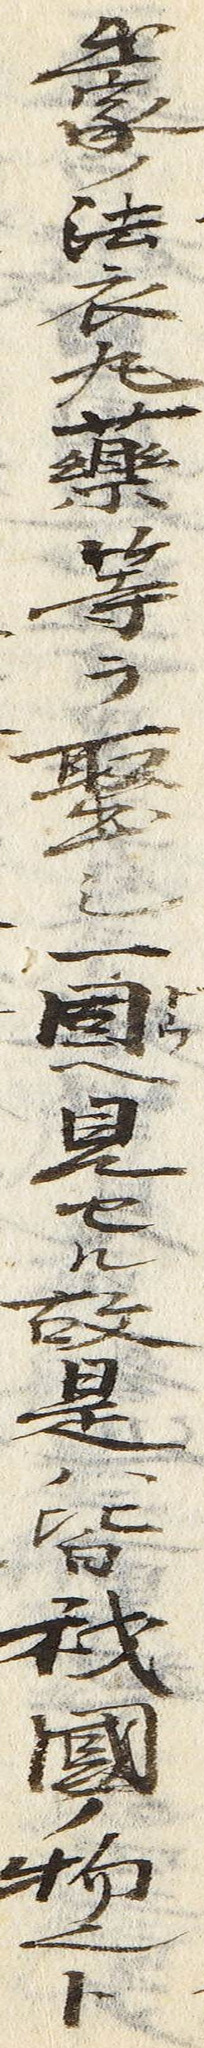出家ノ法衣丸薬等ヲ取出シ一同ヘ見セル故是ハ皆我国ノ物也ト
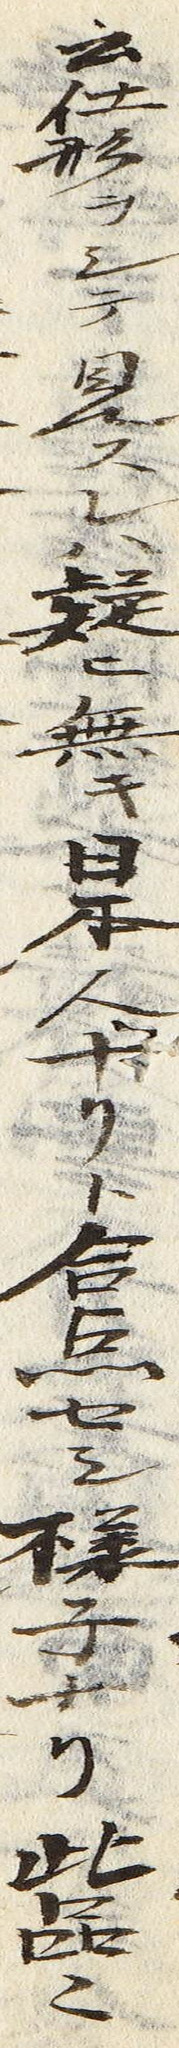云仕形ヲシテ見スレハ疑ヒ無キ日本人ナリト合点セシ様子ナリ此品々
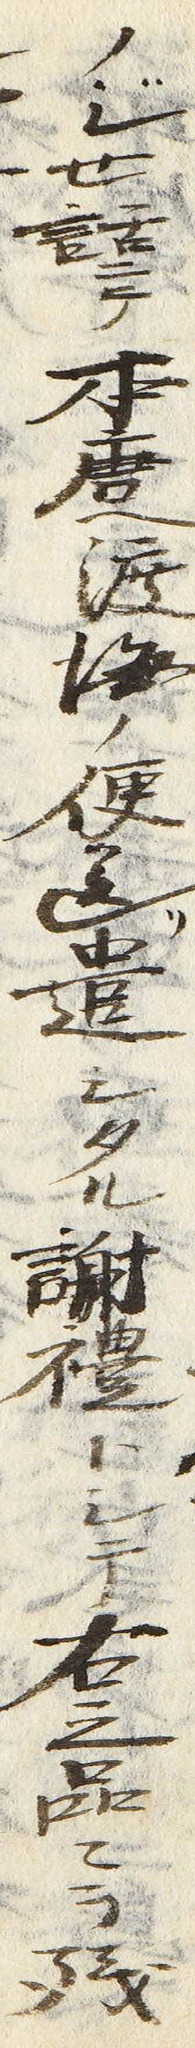ノジ世話ニテ本唐へ渡海ノ便送リ遣シタル謝礼トシテ右之品々ヲ残
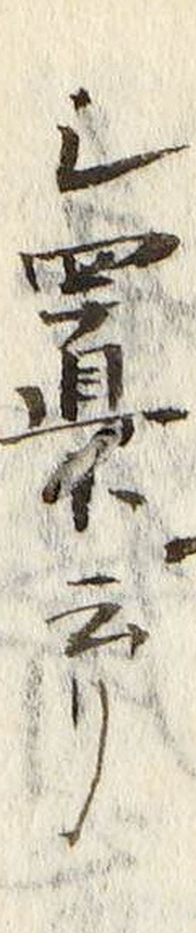シ置ト云リ
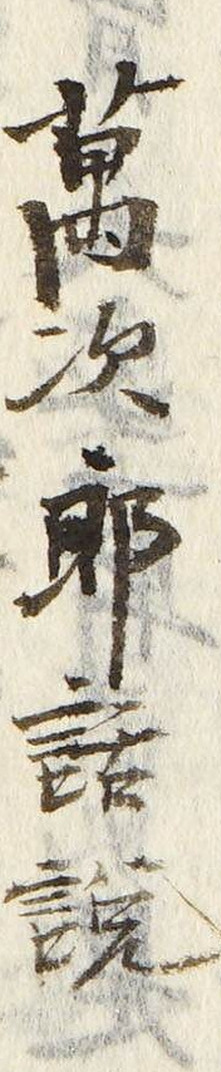萬次郎話説
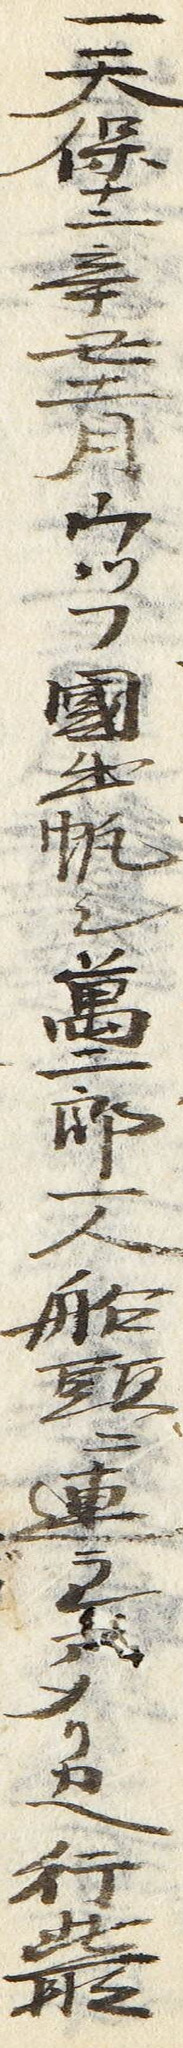一天保十二辛丑十一月ウツフ国出帆シ萬二郎一人船頭ニ連ラレアメリカヘ行此所
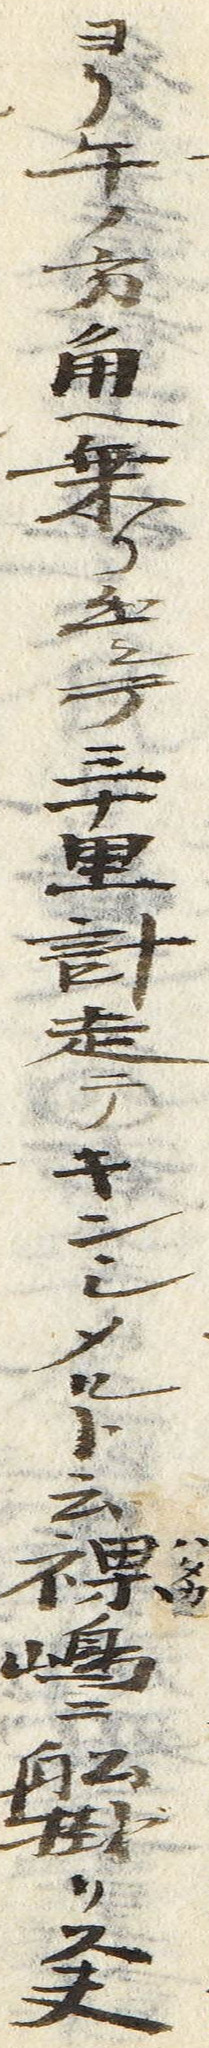ヨリ牛ノ方角ヘ乗リ出シテ三十里計走テキンシメルト云裸嶋ニ船掛リス夫
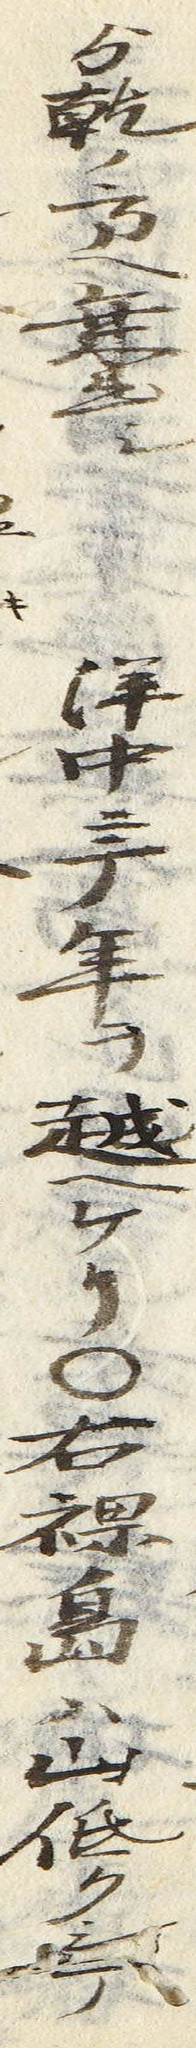ゟ乾ノ方へ乗出シ洋中ニテ年ヲ越ヘケリ〇右裸島ハ山低クシテ
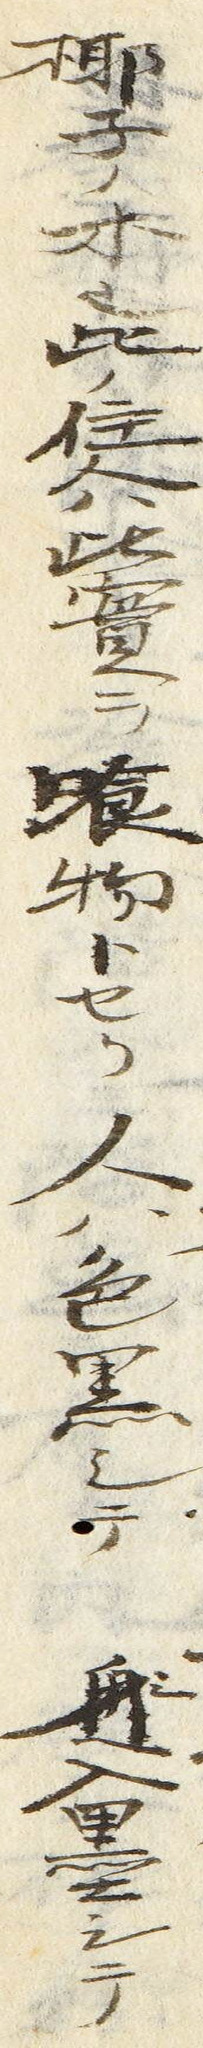椰子ノ木也此ノ住人ハ此実ヲ喰物トセリ人ハ色黒シテ身ヘ入墨シテ

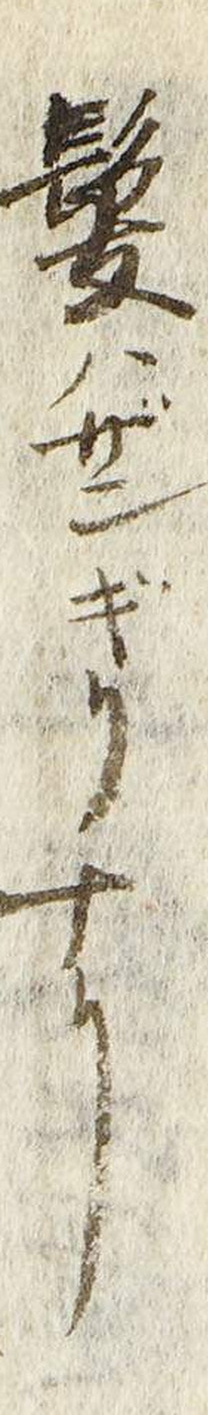髪ハザンギリナリ
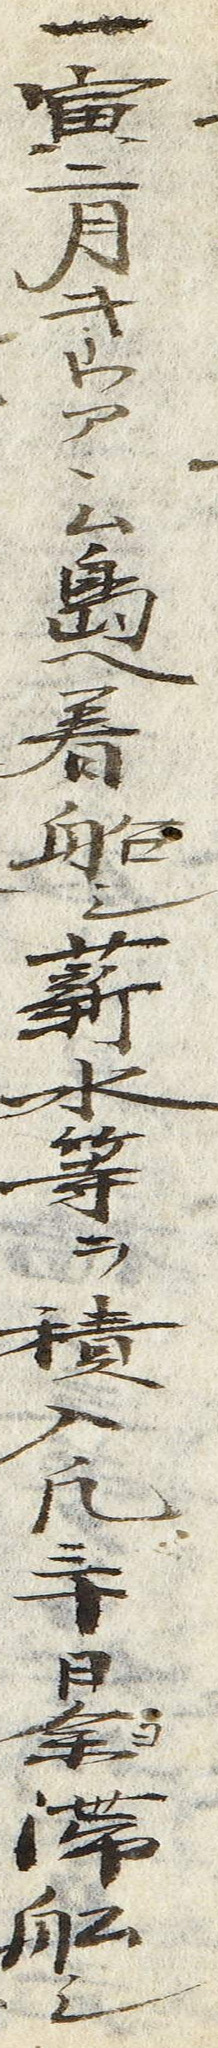一寅二月キウアヽム島ヘ着船シ薪水等ヲ積入凡三十日余滞船シ
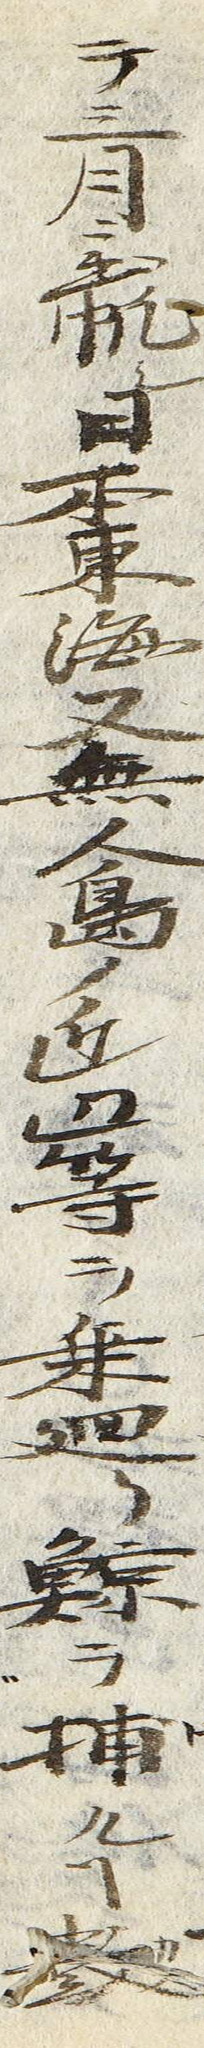テ三月ニ出帆シ日本東海又無人島ノ近辺等ヲ乗廻リ鯨ヲ捕ルコト数
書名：漂流記聞
